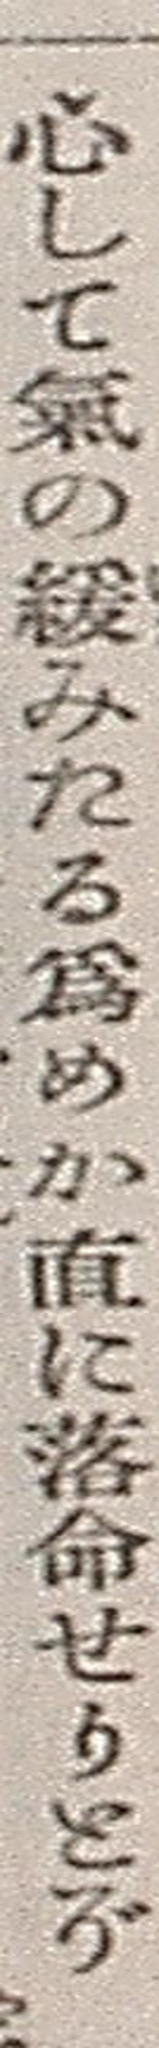心して気の緩みたる為めか直に落命せりとぞ
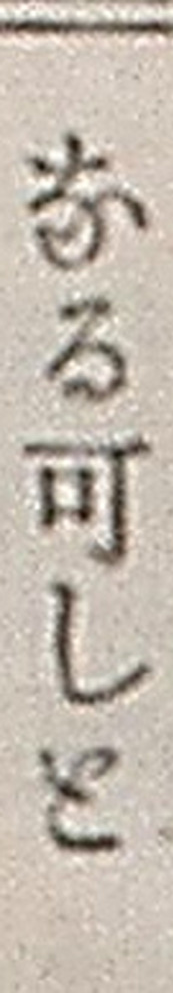なる可しと
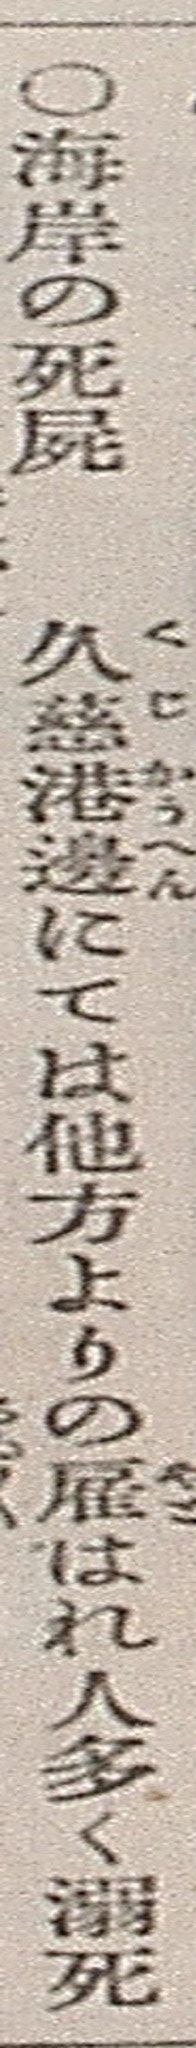〇海岸の死屍久慈港辺にては他方よりの雇はれ人多く溺死
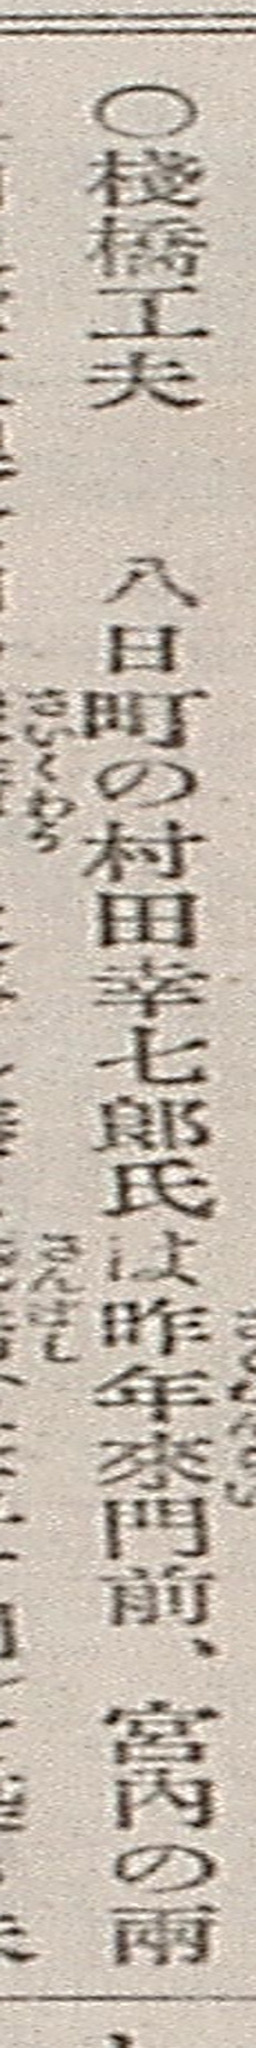〇桟橋工夫八日町の村田幸七郎氏は昨年来門前、宮内の両
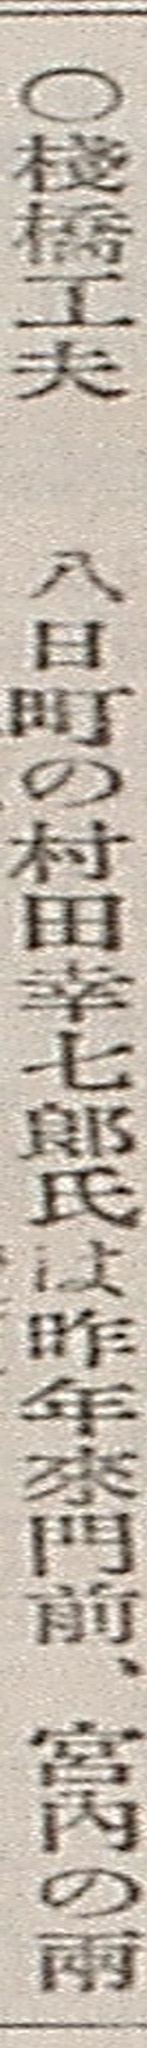〇桟橋工夫八日町の村田幸七郎氏は昨年来門前、宮内の両
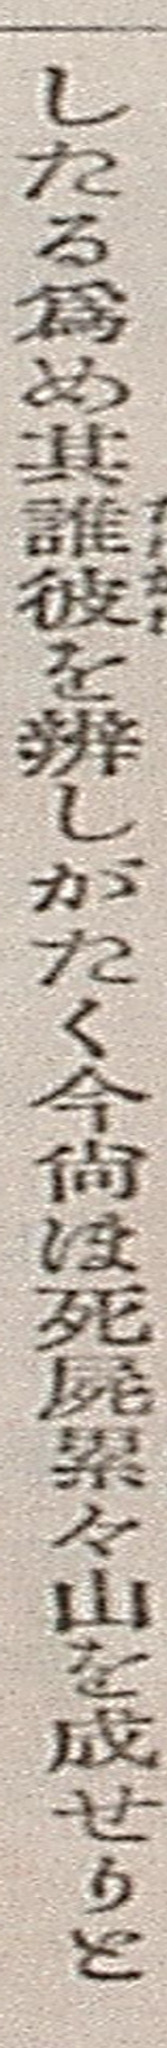したる為め其誰彼を辨しがたく今尚ほ死屍累々山を成せりと
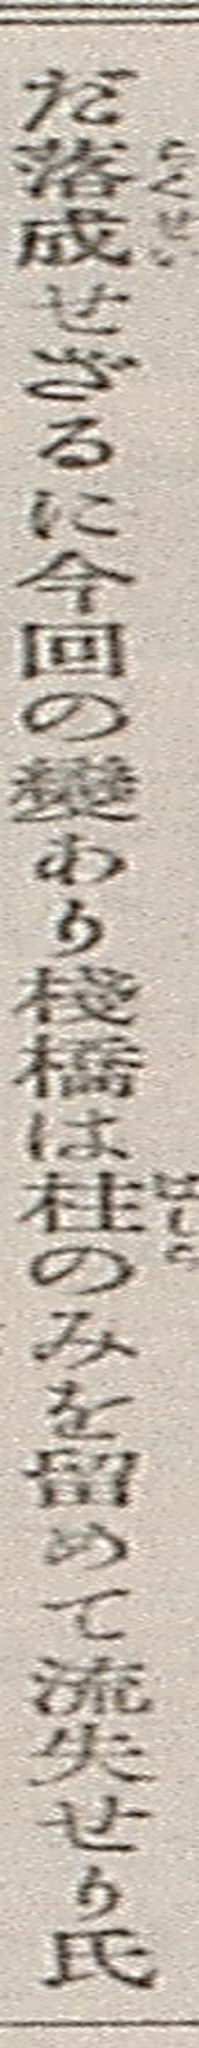だ落成せざるに今回の変あり桟橋は柱のみを留めて流失せり氏
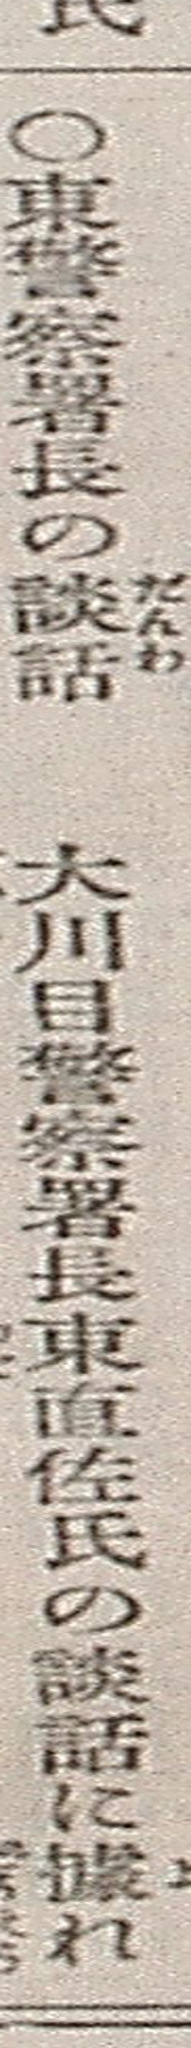〇東警察署長の談話大川目警察署長東直佐氏の談話に拠れ
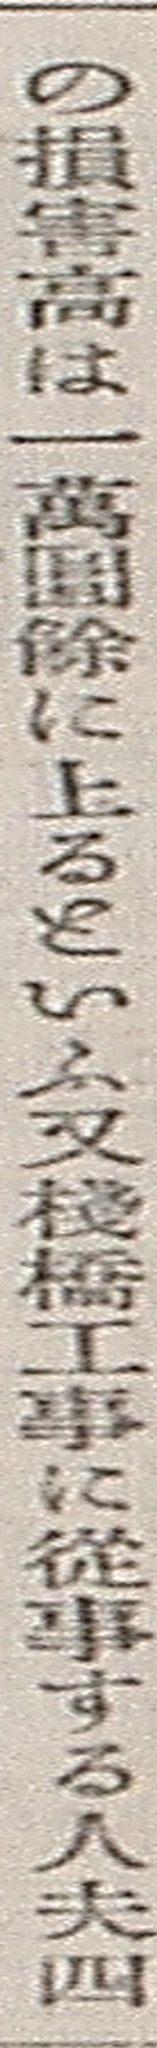の損害高は一万円余に上るといふ又桟橋工事に従事する人夫四
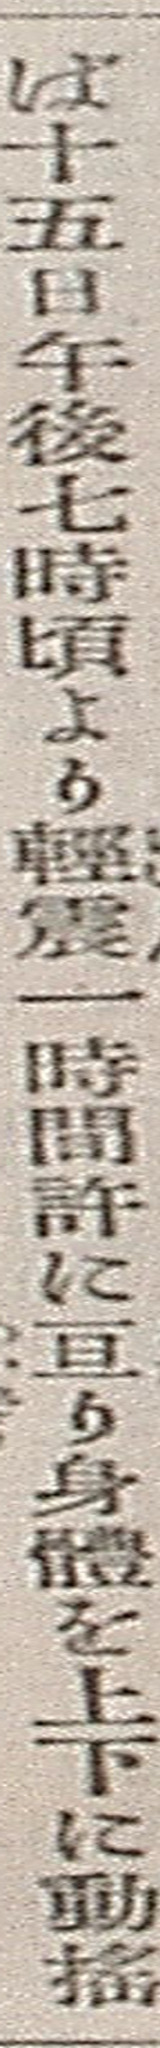ば十五日午後七時頃より軽震一時間許に亘り身体を上下に動揺
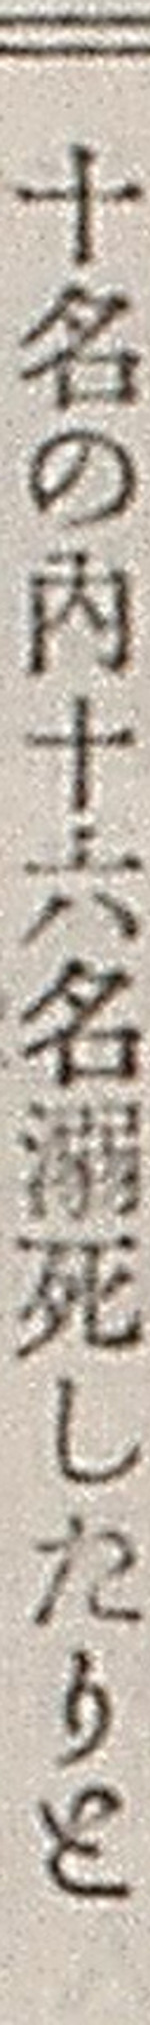十名の内十六名溺死したりと
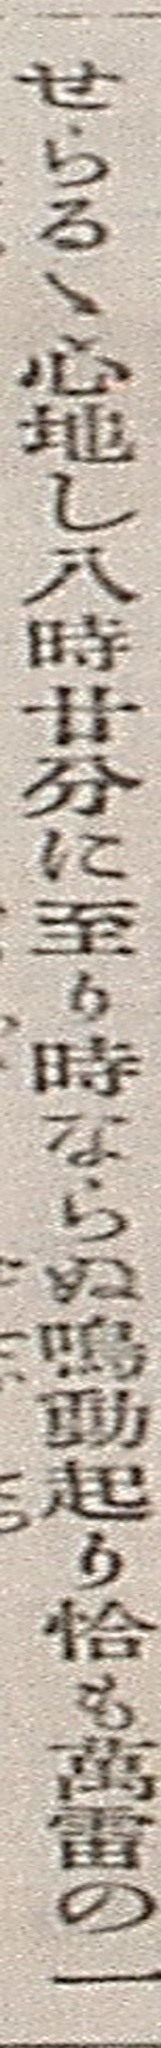せらるゝ心地し八時廿分に至り時ならぬ鳴動起り恰も万雷の一
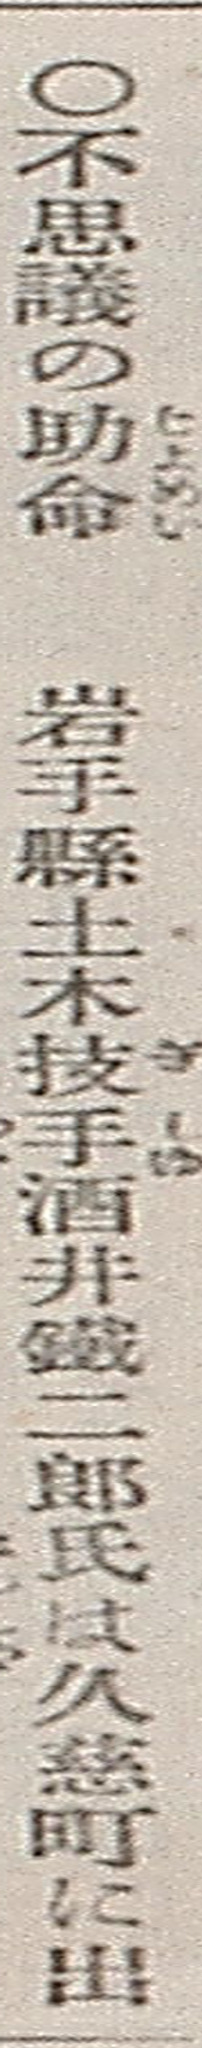〇不思議の助命岩手県土木技手酒井鐵二郎氏は久慈町に出
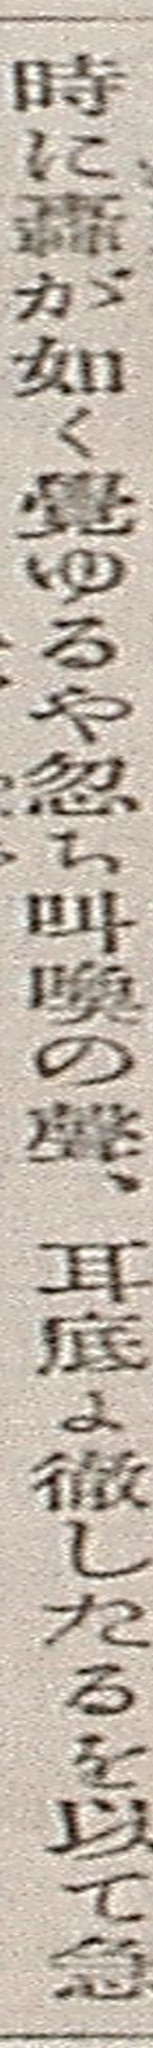時に轟が如く覚ゆるや忽ち叫喚の声、耳底に徹したるを以て急
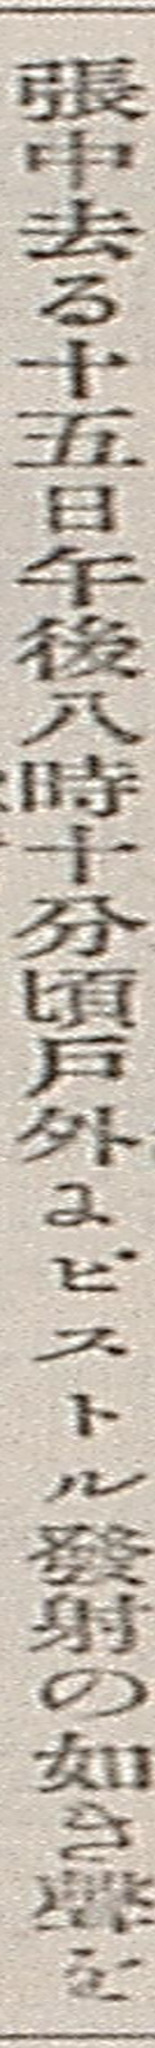張中去る十五日午後八時十分頃戸外にピストル発射の如き声を
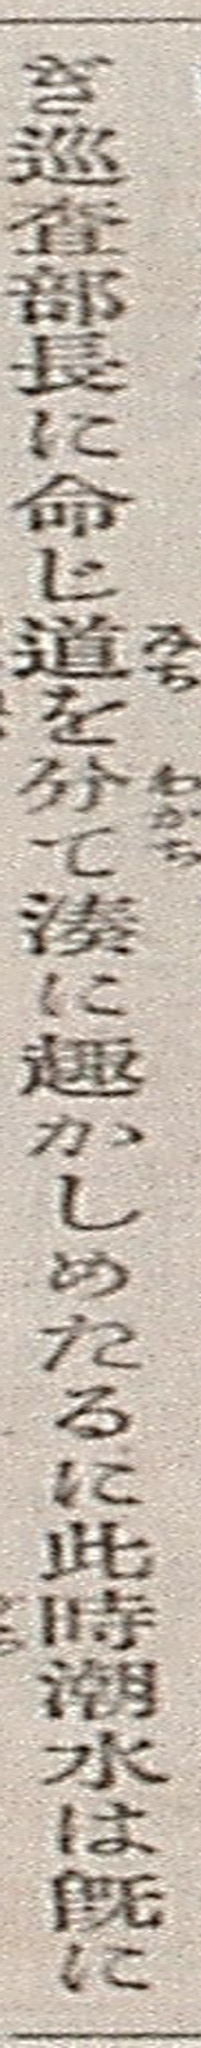ぎ巡査部長に命じ道を分て湊に趣かしめたるに此時潮水は既に
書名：風俗畫報臨時増刊第百十九號　大海嘯被害録（中）
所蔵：東京大学地震研究所図書室 Earthquake Research Institute Library, The University of Tokyo, JAPAN
